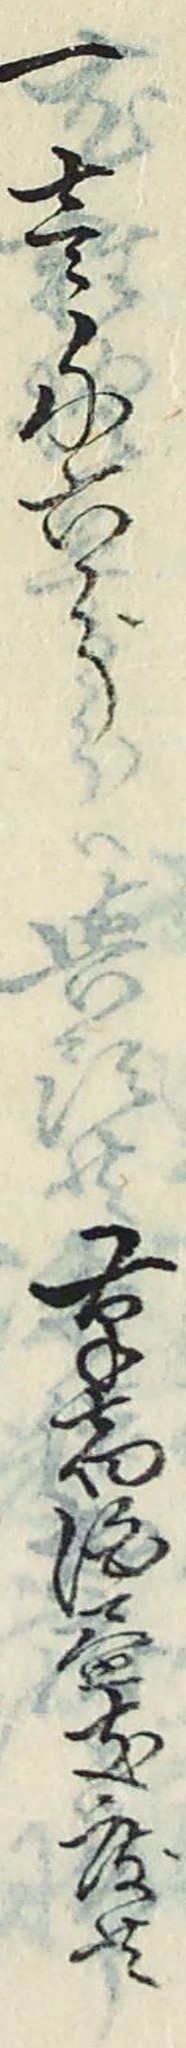一壱匁六分筆者泊昼仕度共
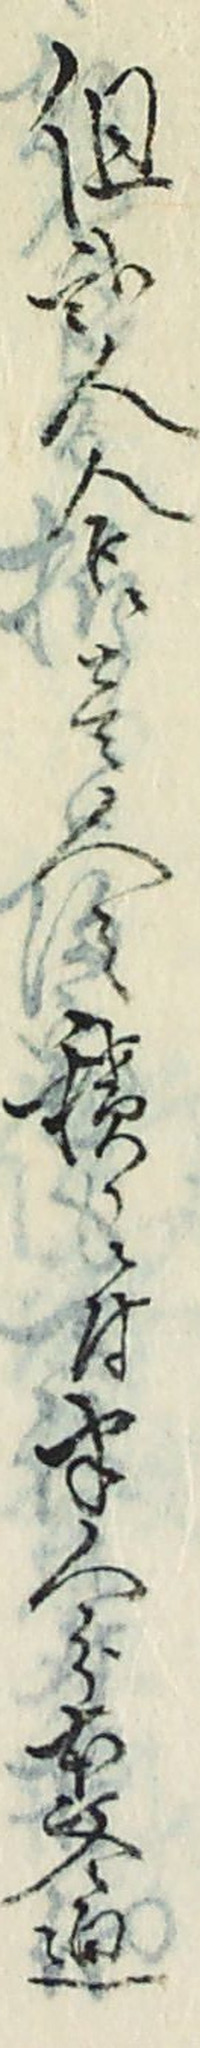但弐人合ニ壱人之積りニ付半人分本文之通
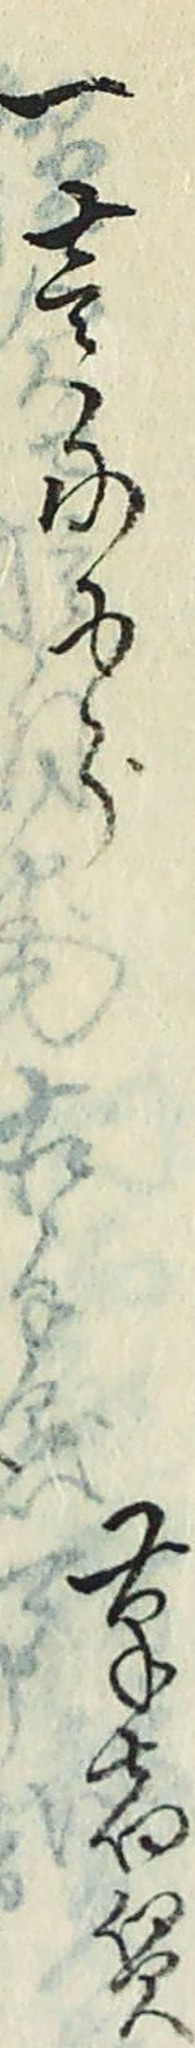一壱匁五分筆者賃
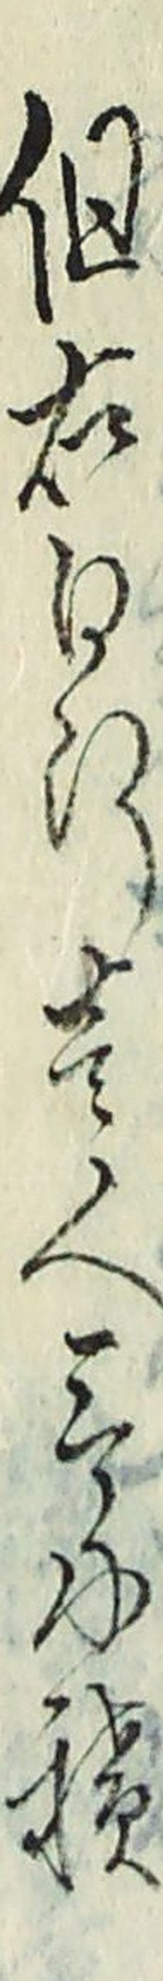但右同断壱人三匁積
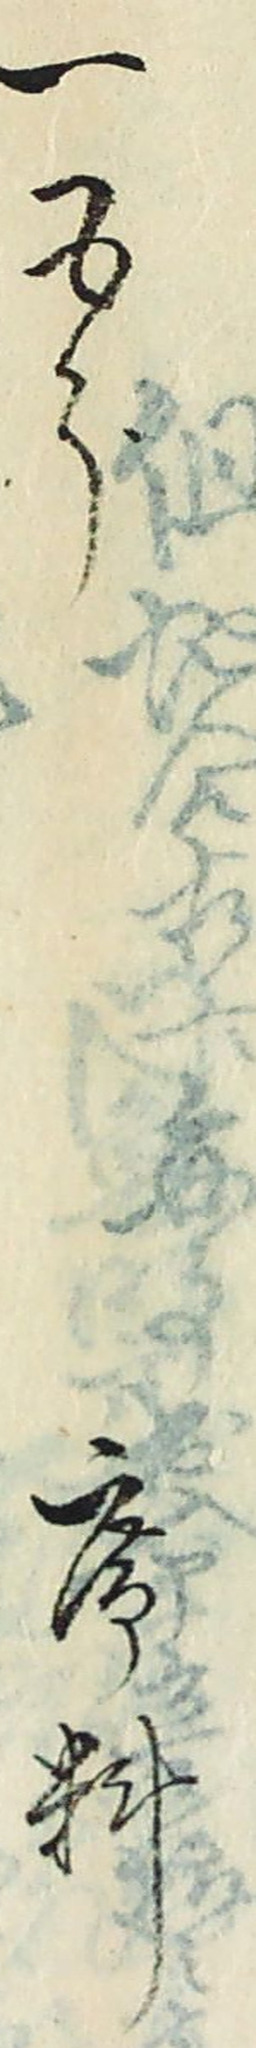一五分席料
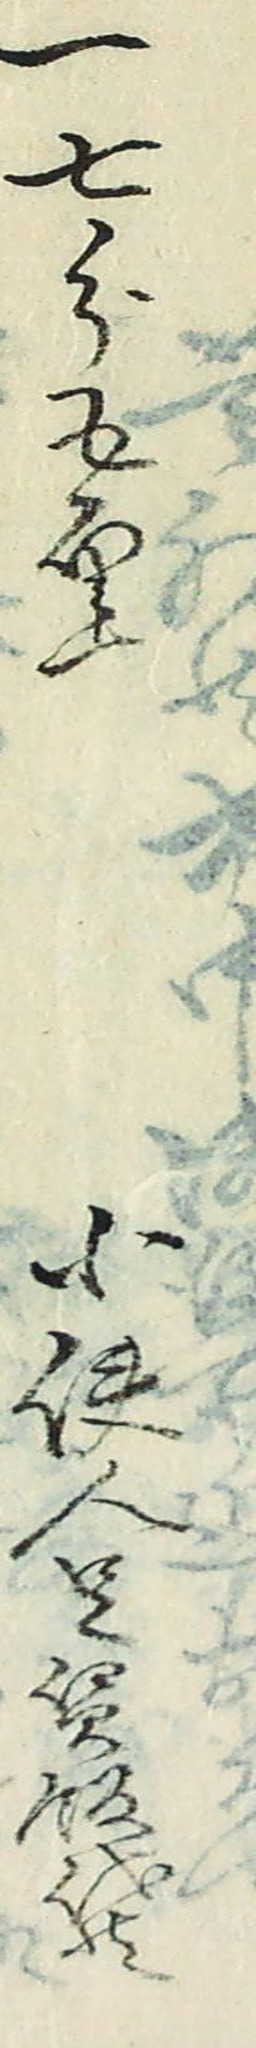一七分五厘小使人足賃飯代共
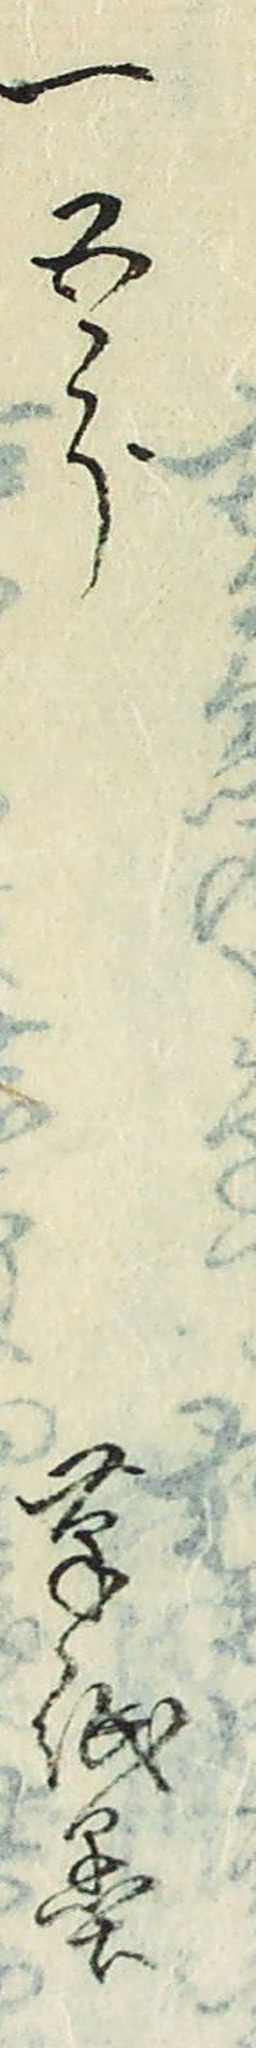一五分筆紙墨
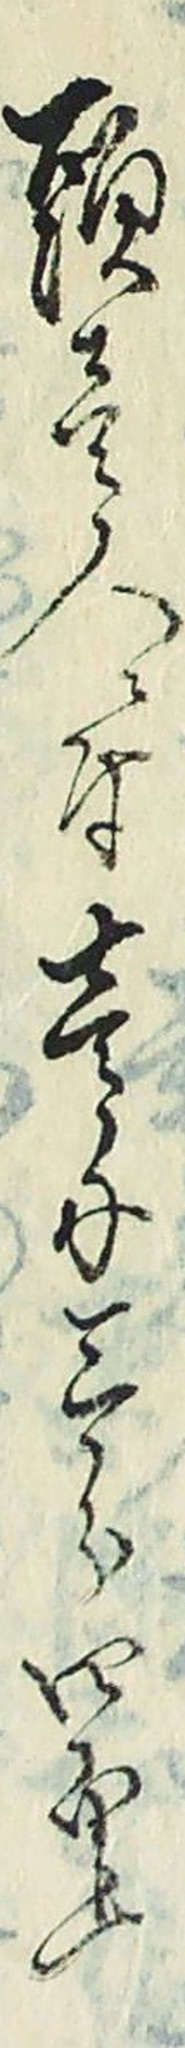頭壱人ニ付壱匁三分四厘
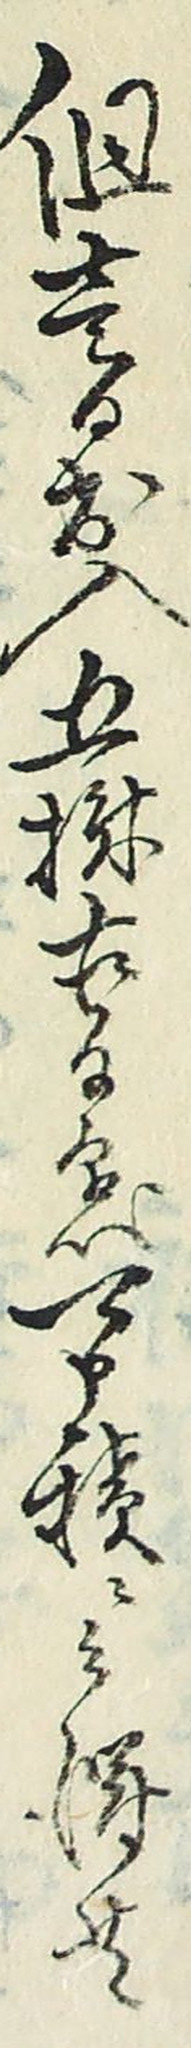但壱日出入五株相手懸可申積ニ候得共
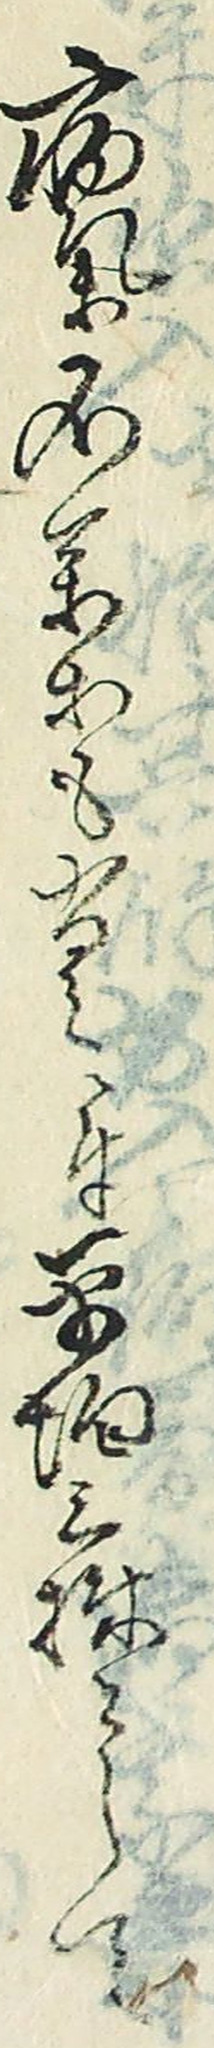病氣不参等も有之ニ付平均三株として
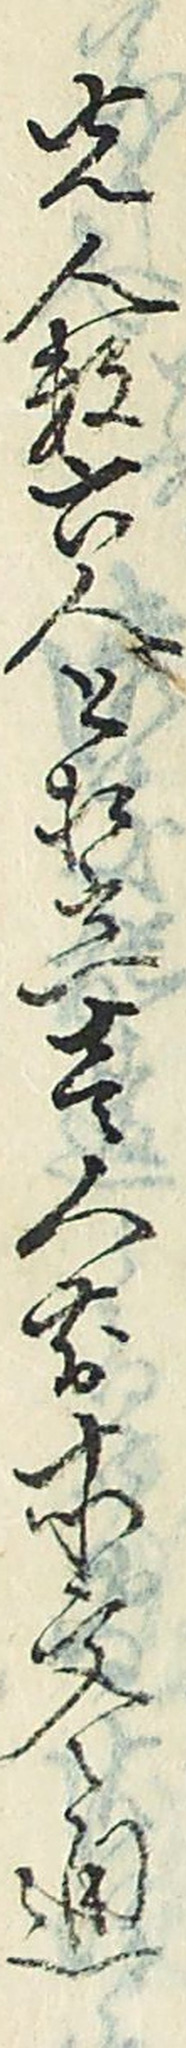先人数六人と相立壱人前本文之通

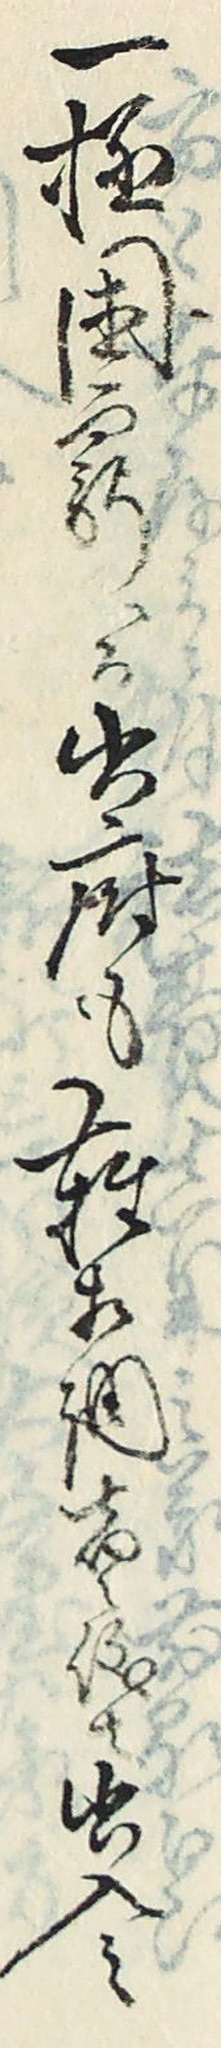一極困窮ニ而出府も難相調者之儀者出入之
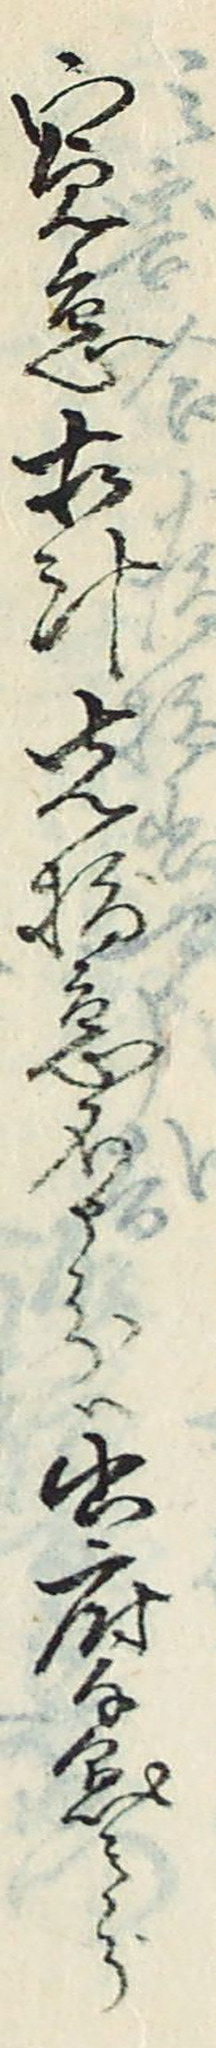寛急相計先指急不申分ハ出府手懸之分
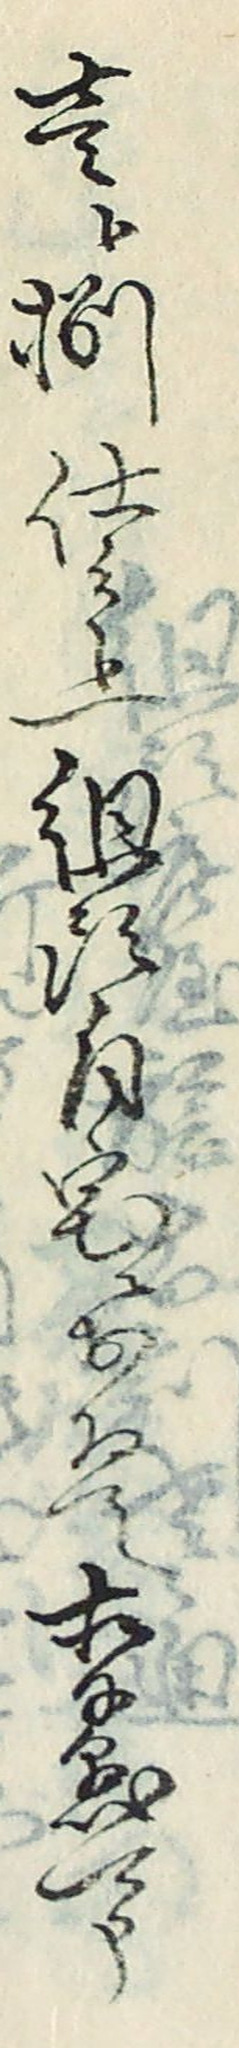壱ト捌仕候上組頭自宅ニおゐて相手懸可申
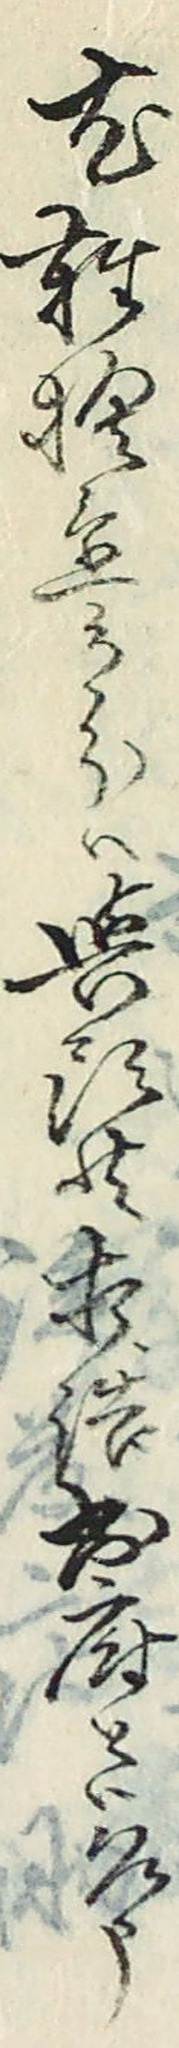尤難捨置候分ハ與頭共相詰出府とハ乍申
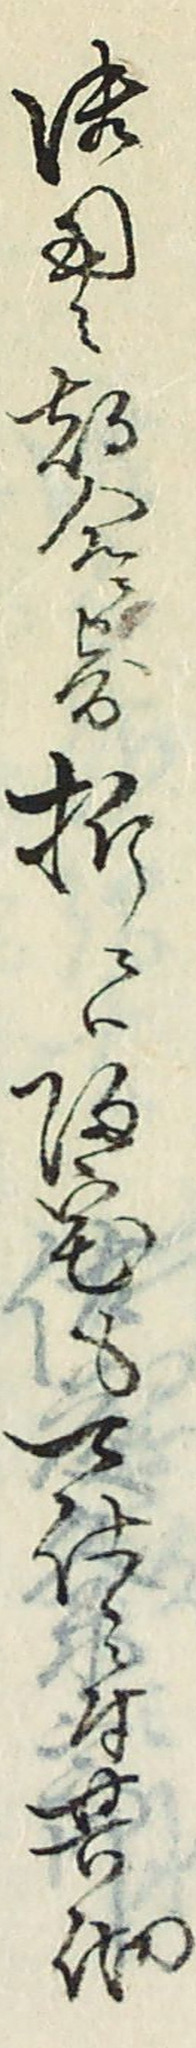御用之都合ニ寄折ニハ帰宅も可仕候ニ付其砌
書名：諸御趣意書并御下知向之写
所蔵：鳴門教育大学 Naruto University of Education
